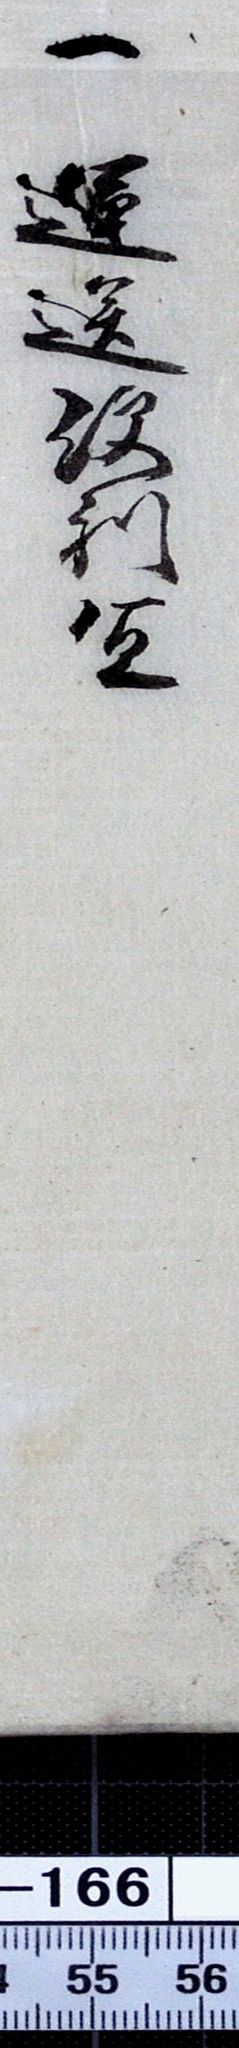一運送便利宜
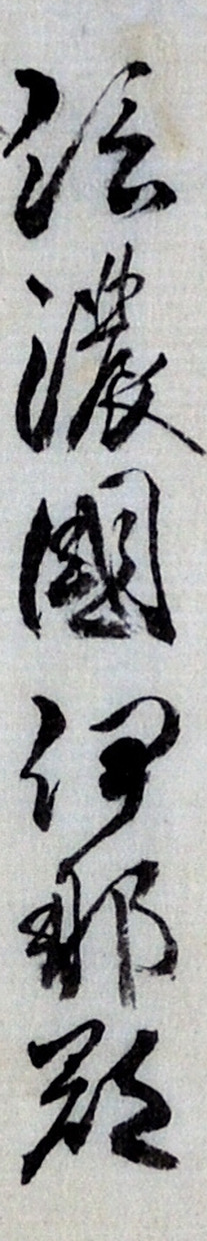信濃国伊那郡
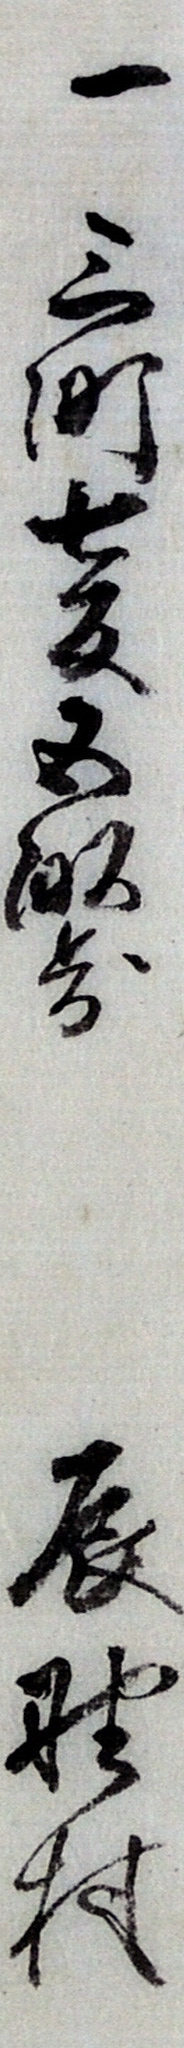一三町七反五㽗歩辰野村
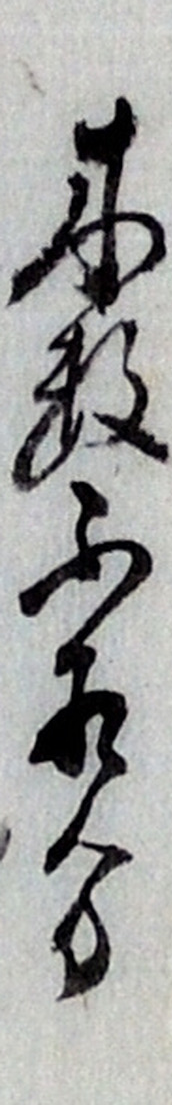木数不相分
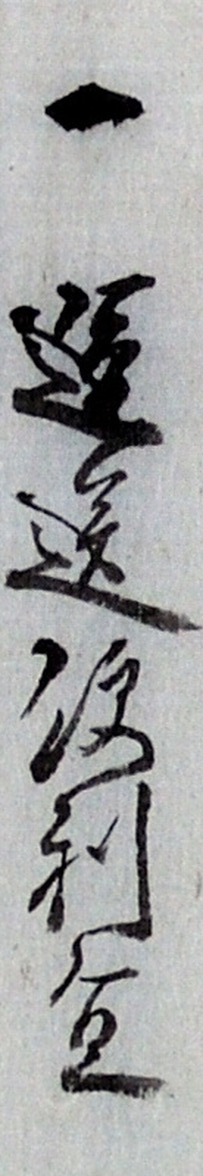一運送便利宜

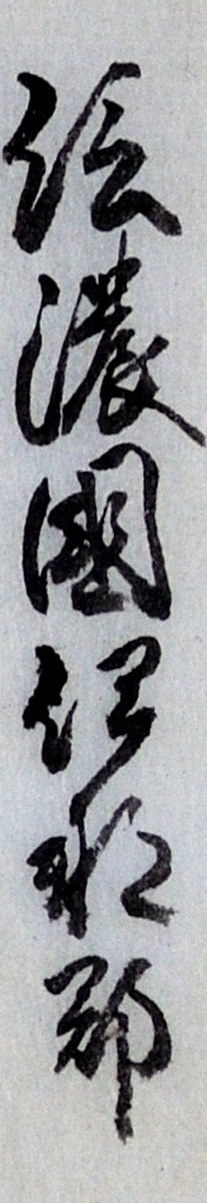信濃国伊那郡
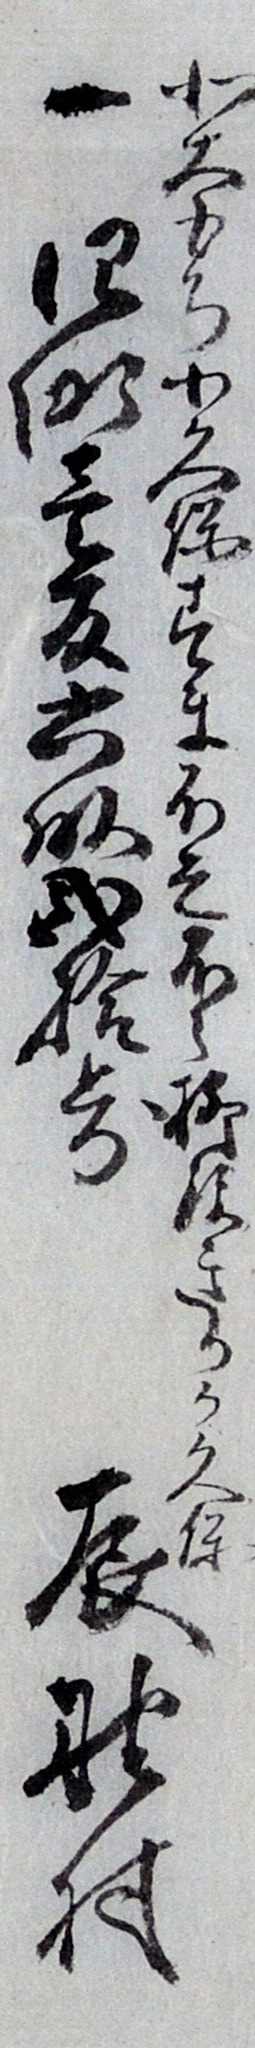一四町壱反六㽗弐拾歩辰野村
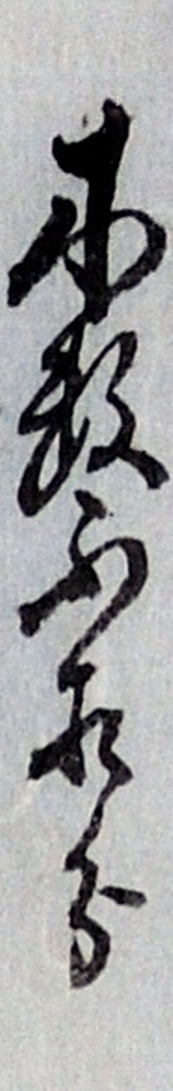木数不相分
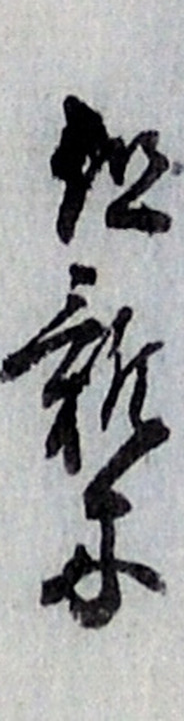但雑木
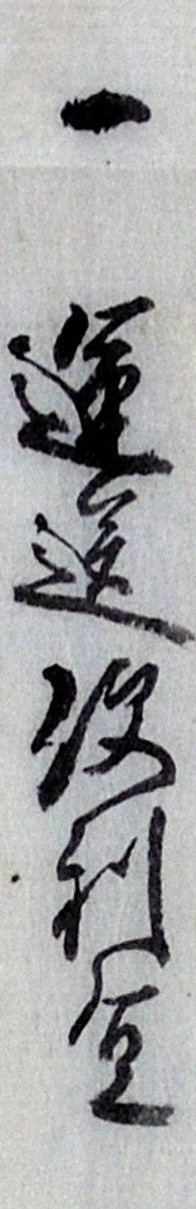一運送便利宜
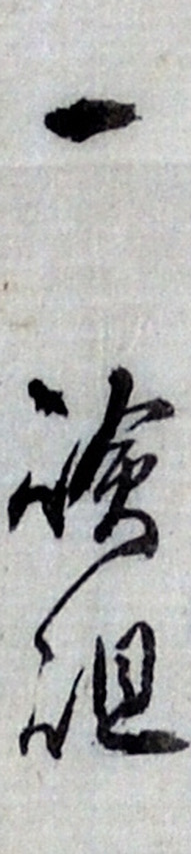一嶮岨
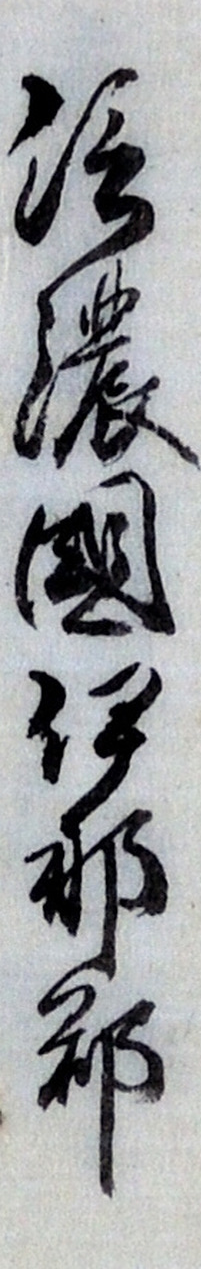信濃国伊那郡
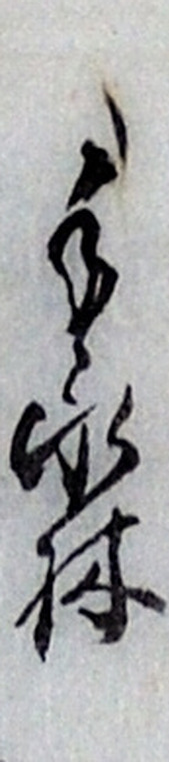手永林
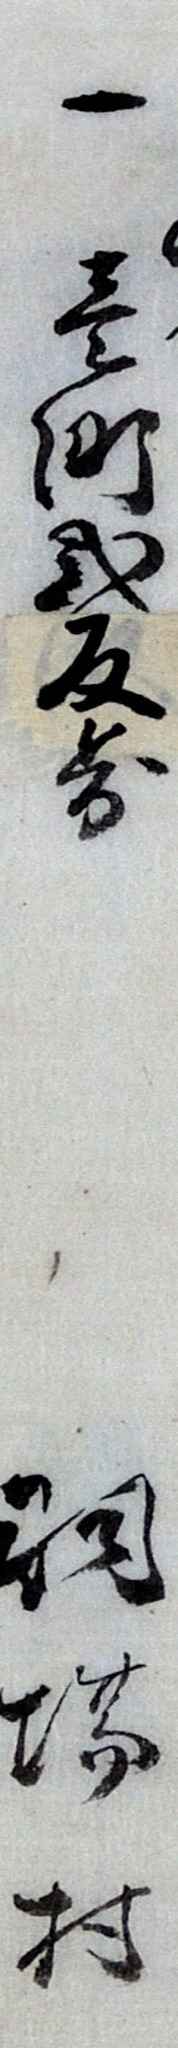一壱町弐反歩羽場村
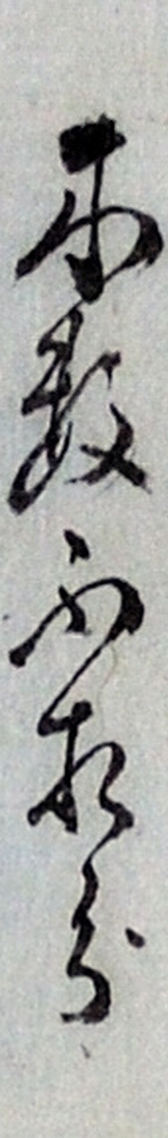木数不相分
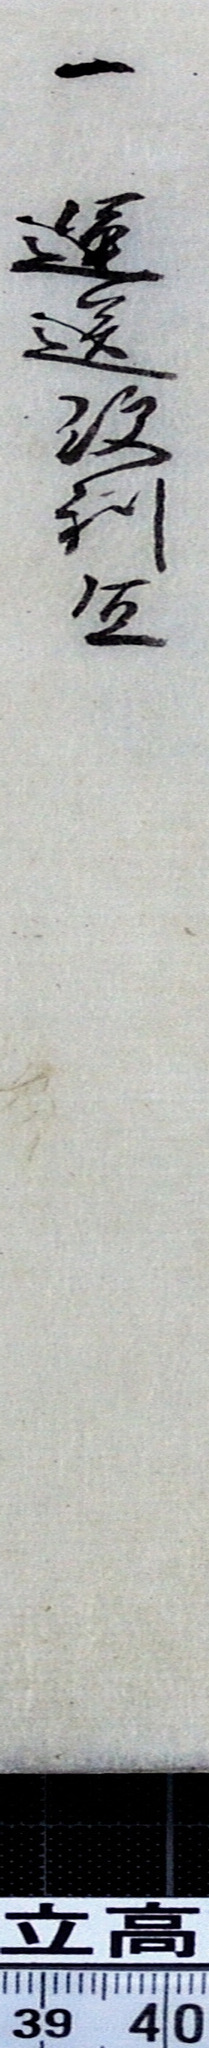一運送便利宜
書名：官林反別帳
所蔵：伊那市立高遠町図書館・合同会社AMANE
